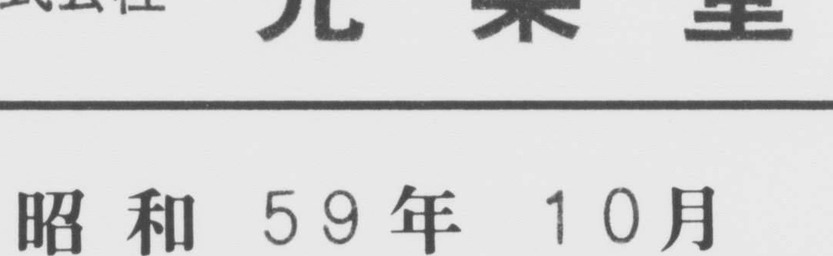昭和年月
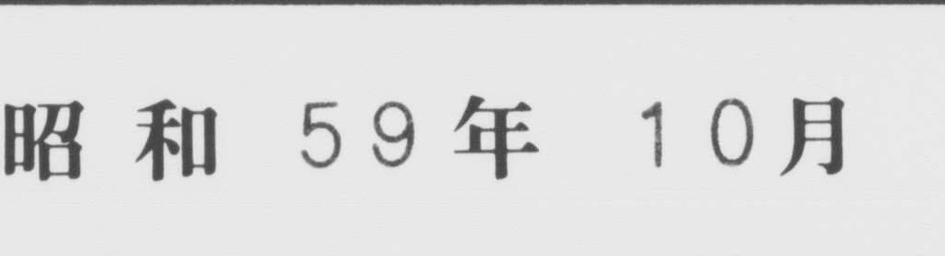昭和年月
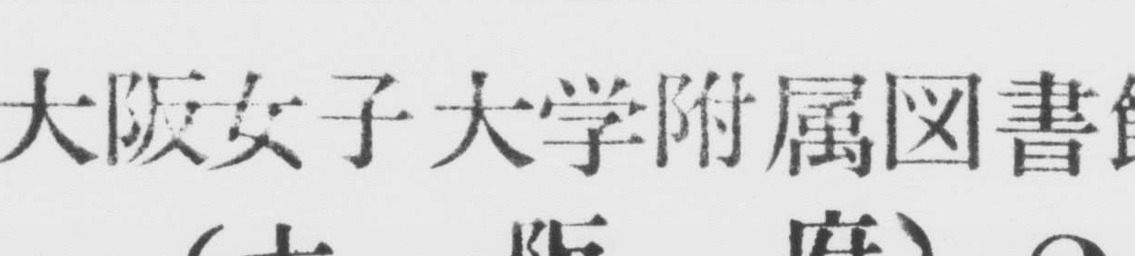大阪女子大学附属図書館
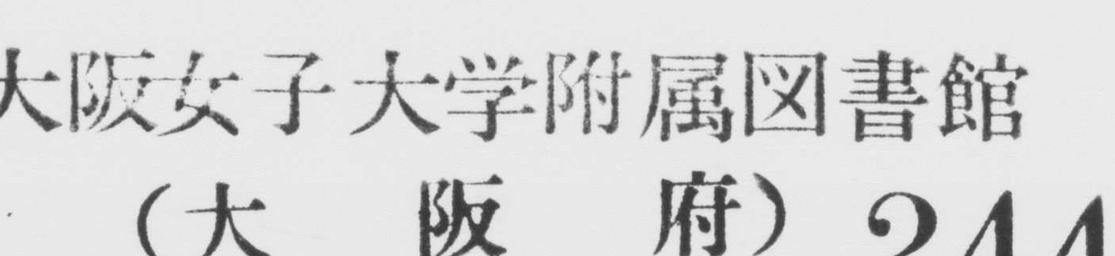大阪女子大学附属図書館
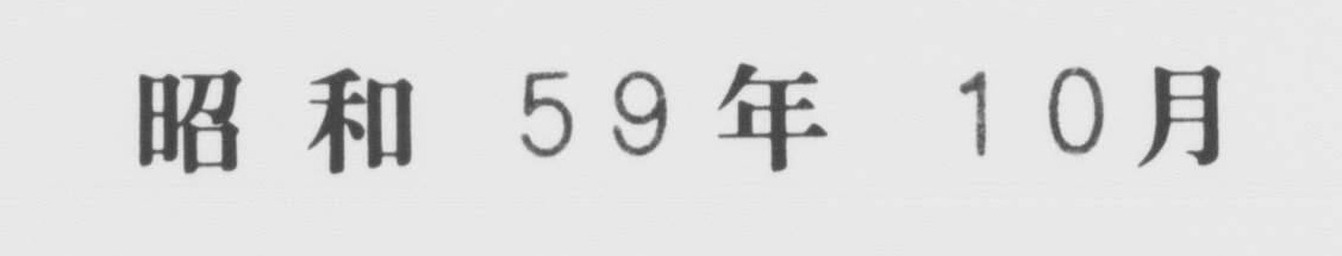昭和年月
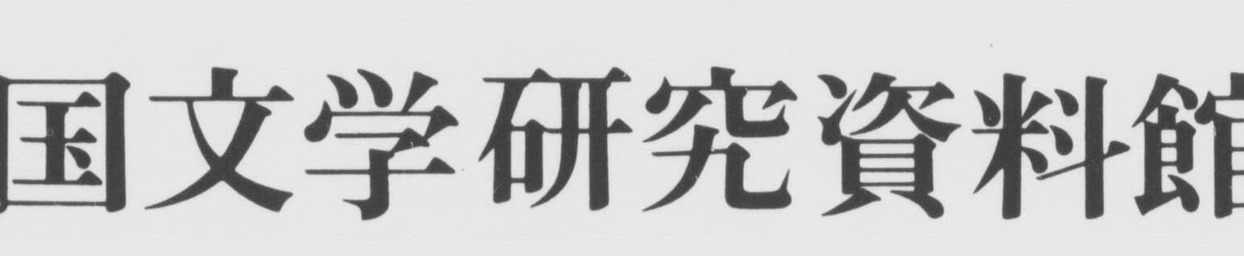国文学研究資料館
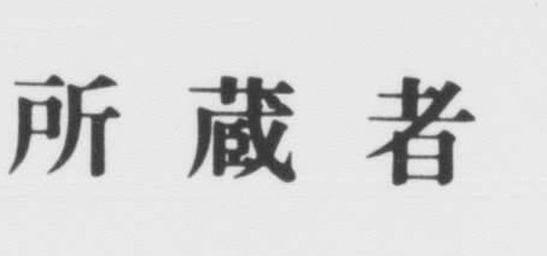所蔵者
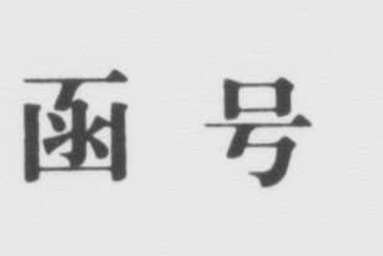函号-

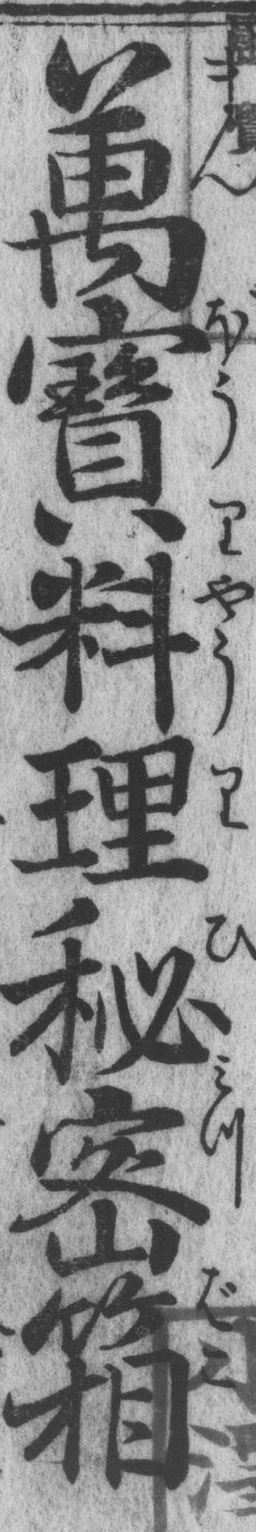萬寳料理秘密箱序
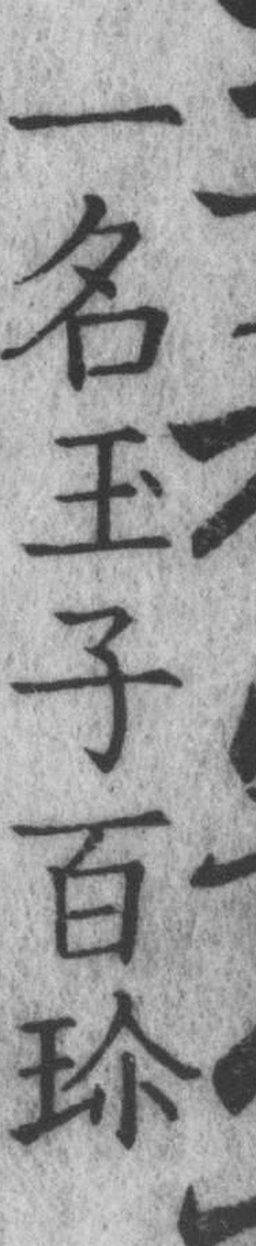一名玉子百珍
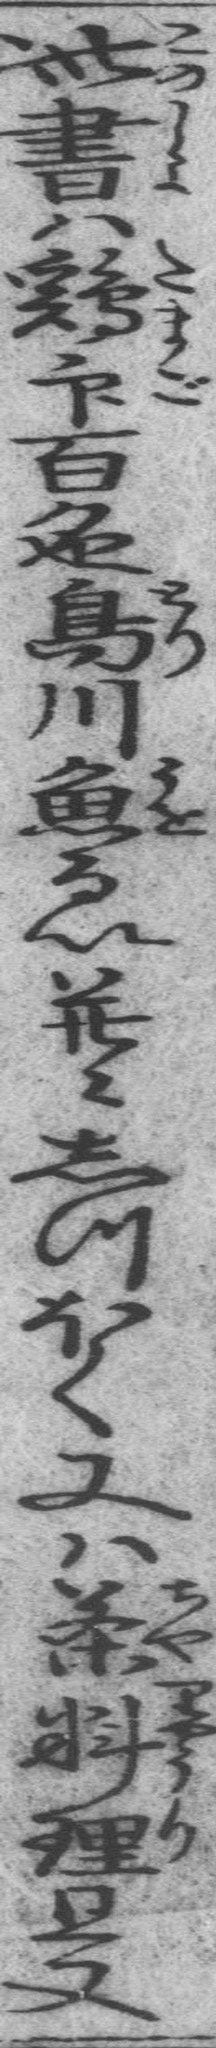此書は鶏卵百色鳥川魚るい并にしつほく又は茶料理且又
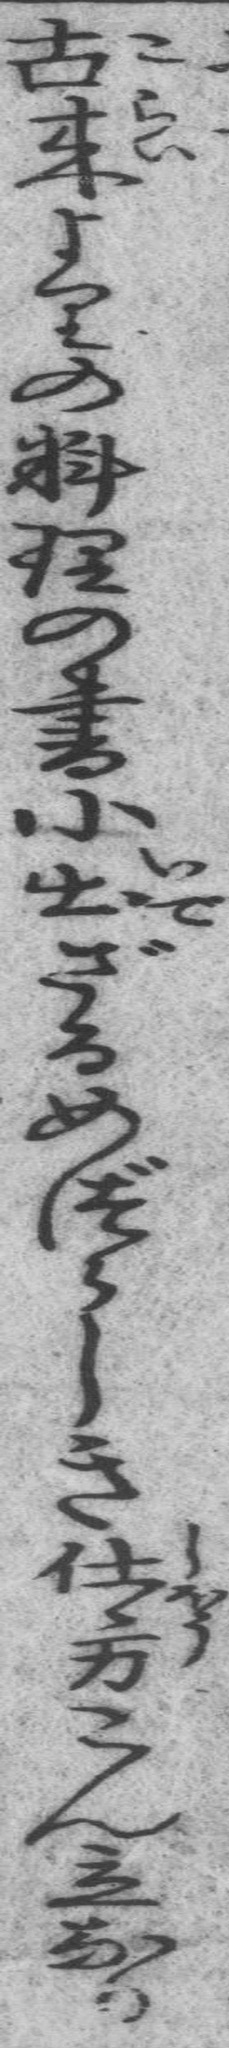古来よりの料理の書に出ざるめづらしき仕方こん立なり
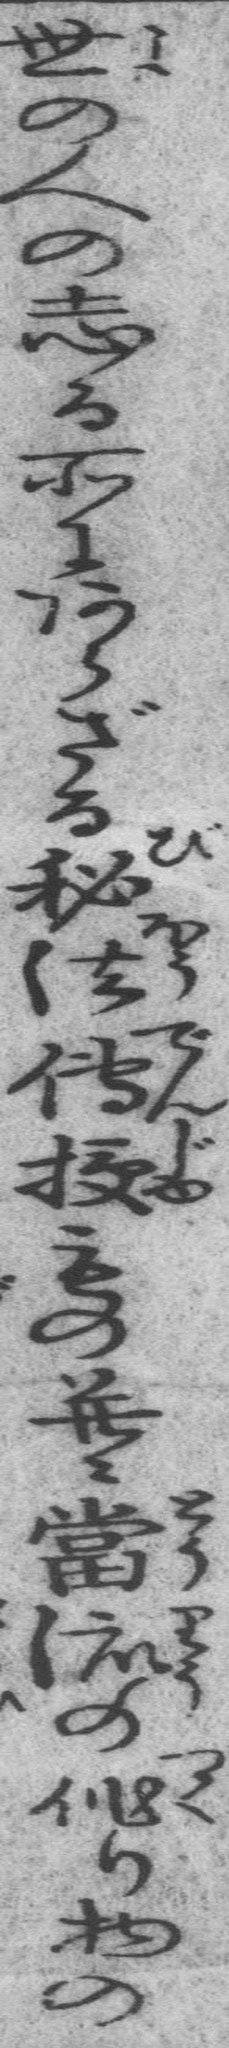世の人のしる所にあらざる秘法伝授もの并に当流の作り物の
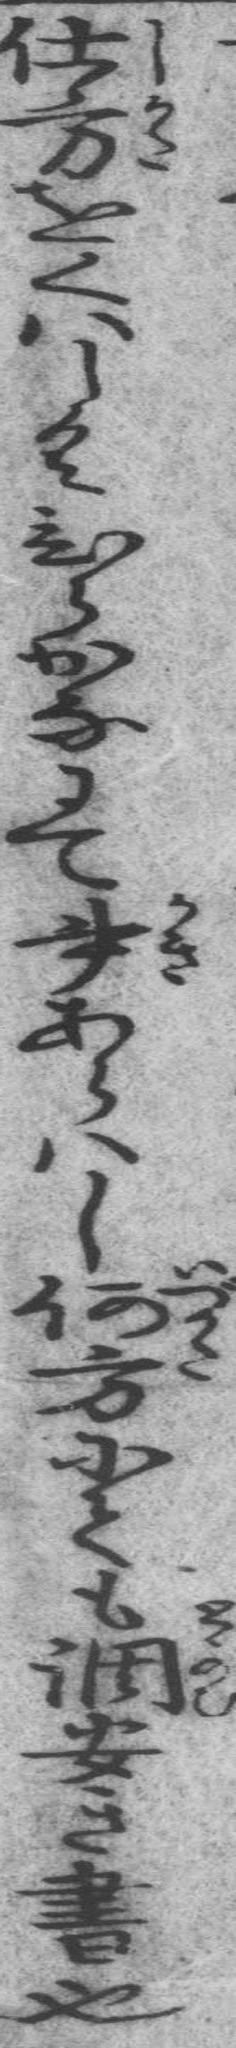仕方をくはしくひらかなにて書あらはし何方にても調安き書也
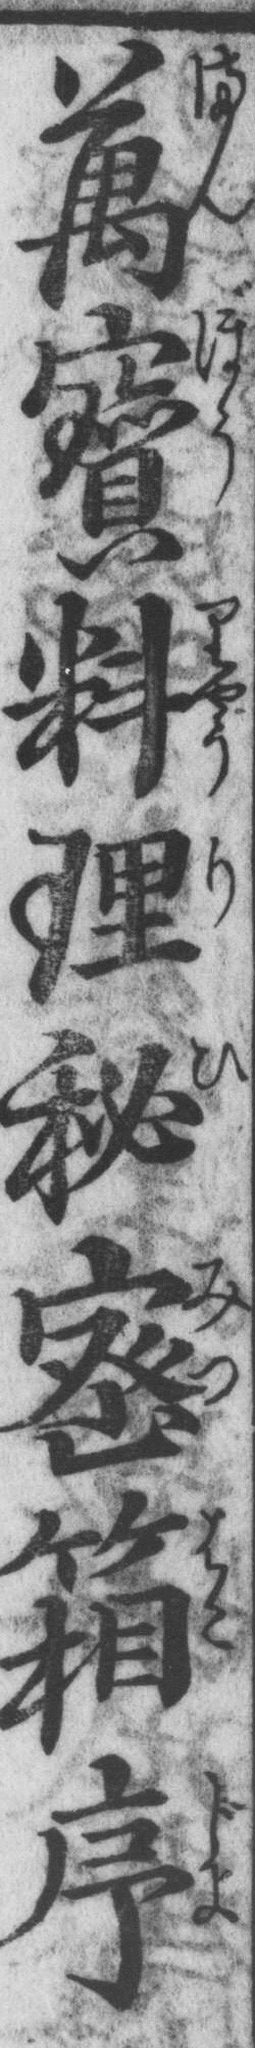萬寳料理秘密箱序
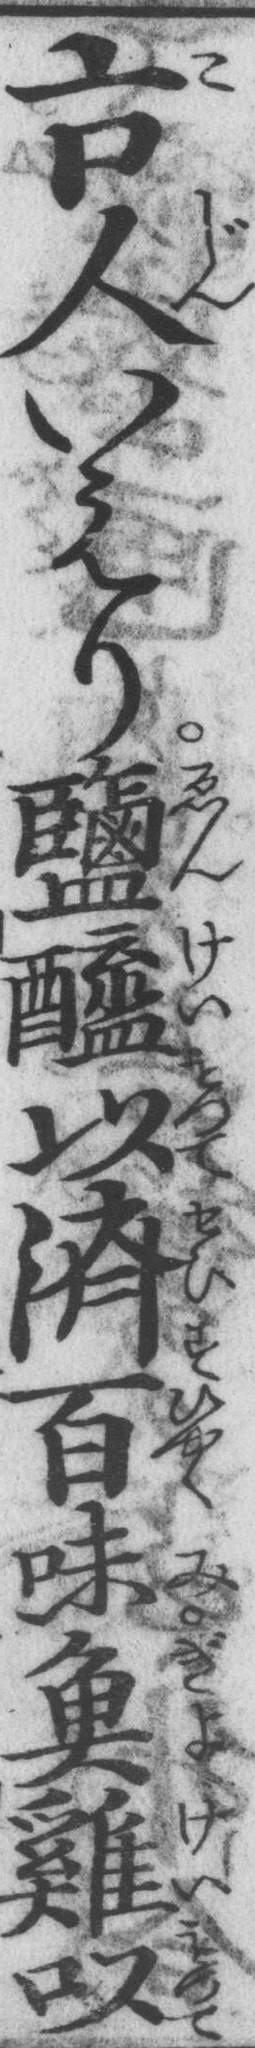古人いえり。塩醯以済百味。魚鶏以
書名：萬寳料理秘密箱
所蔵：大阪府立大学学術情報センター 国文学研究資料館
